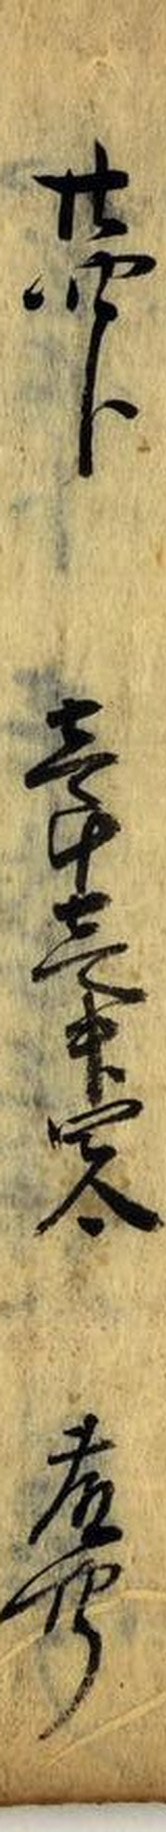同廿四分壱斗壱升四合藤四郎
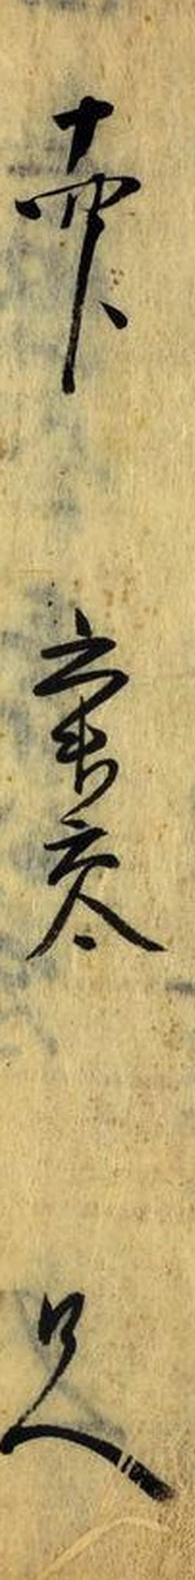同十四分六升六合同人
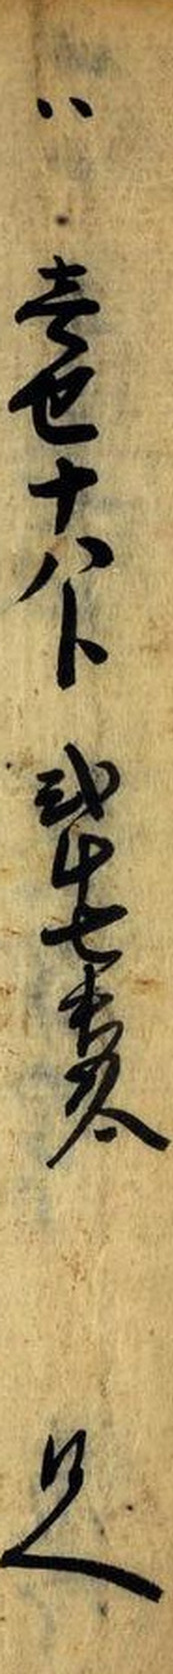同壱セ十八分弐斗七升五合同人
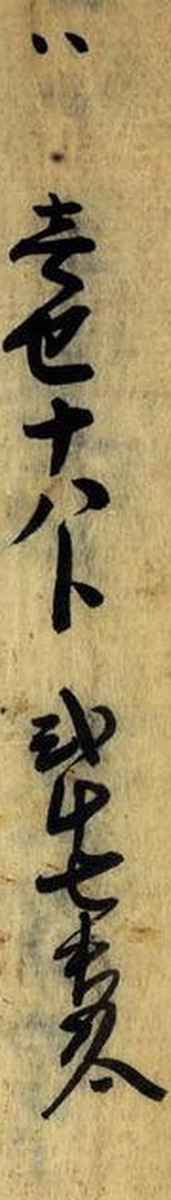同壱セ十八分弐斗七升五合同人
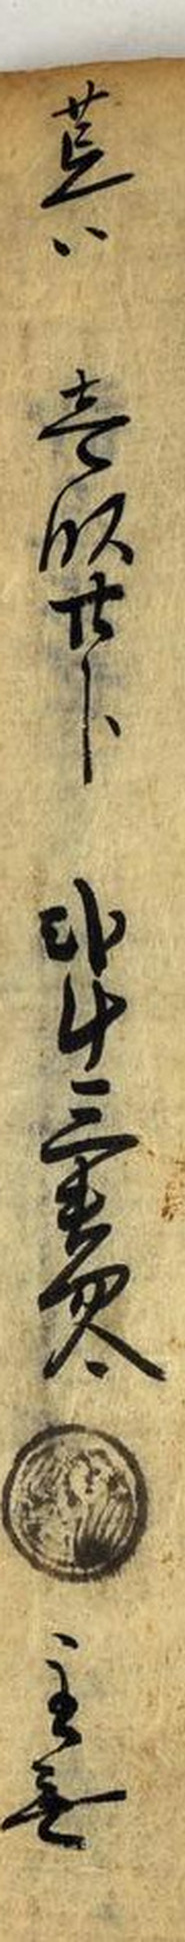荒同壱畝廿分弐斗三升四合㊞主無
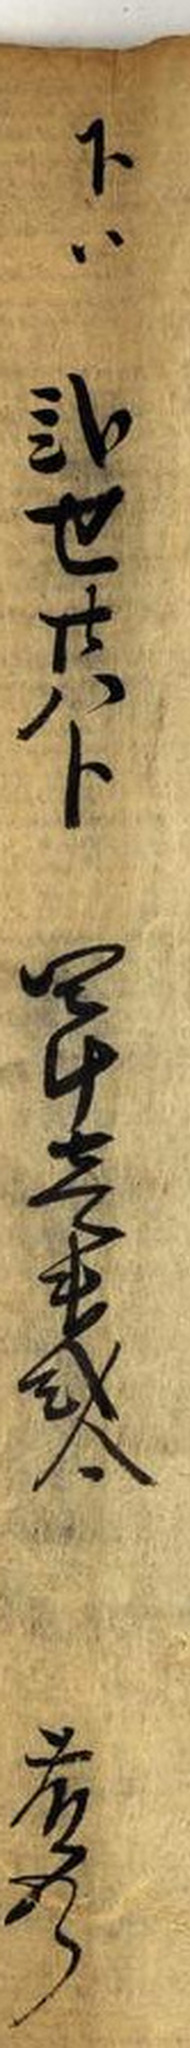下同弐セ廿八分四斗壱升弐合藤五郎
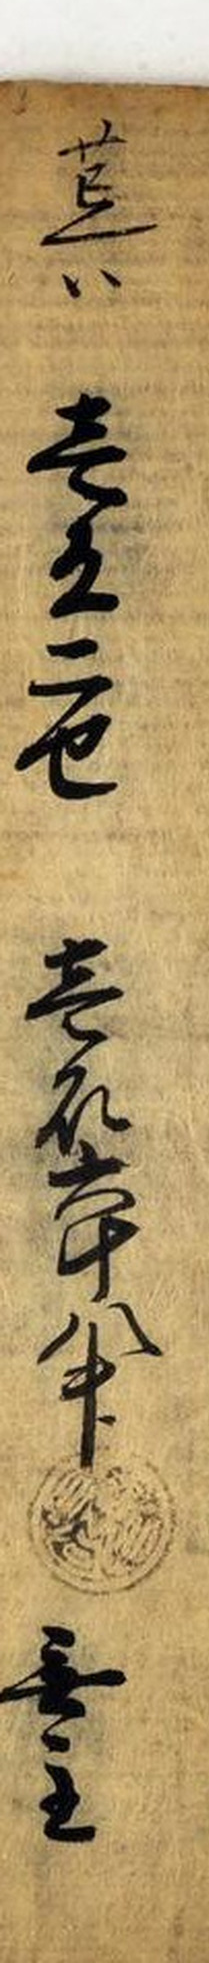荒同壱反二セ壱石六斗八升㊞無主
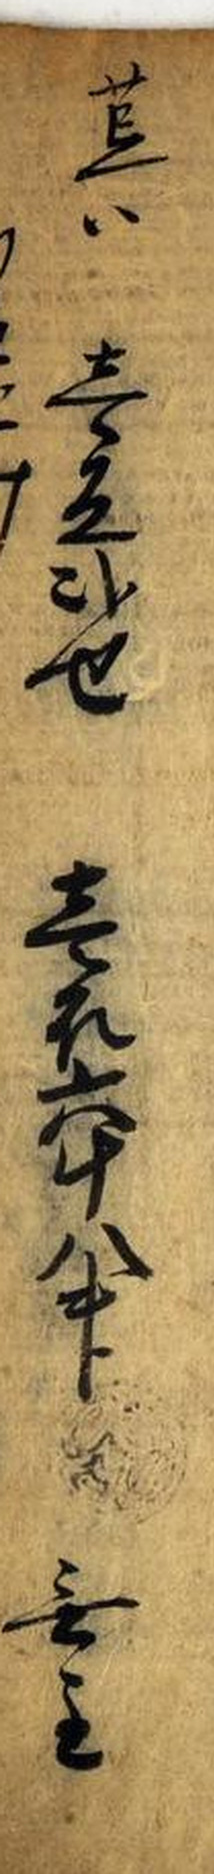荒同壱反弐セ壱石六斗八升㊞無主
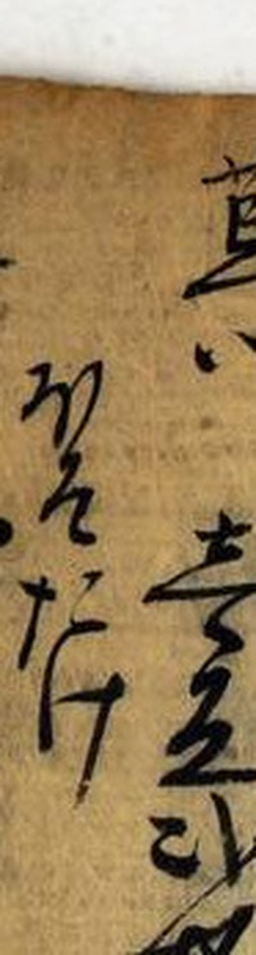ほそたけ
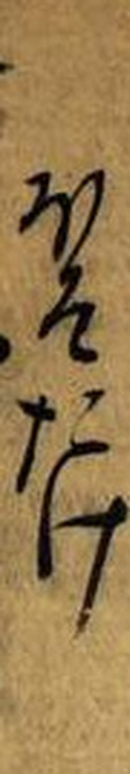ほそたけ
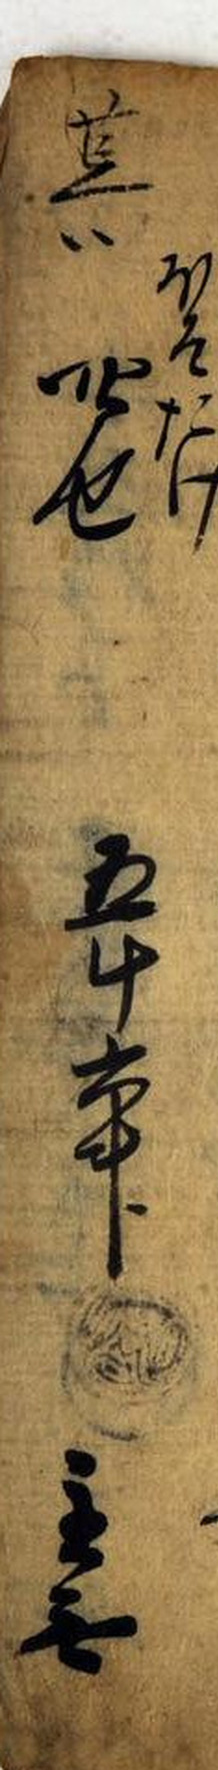荒同四セ五斗六升㊞主無

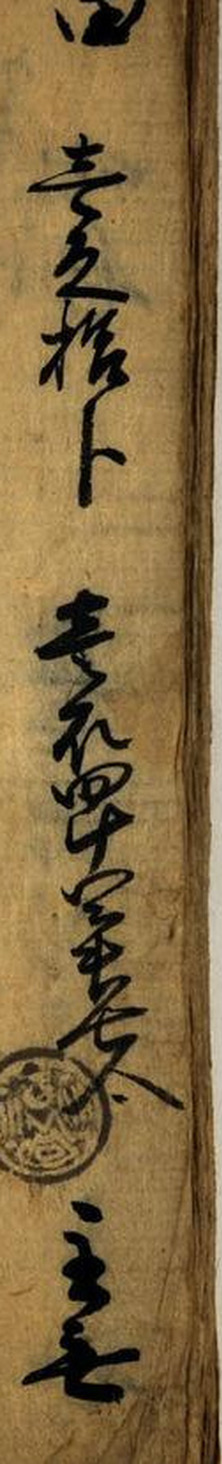荒田壱反拾分壱石四斗四升七合㊞主無
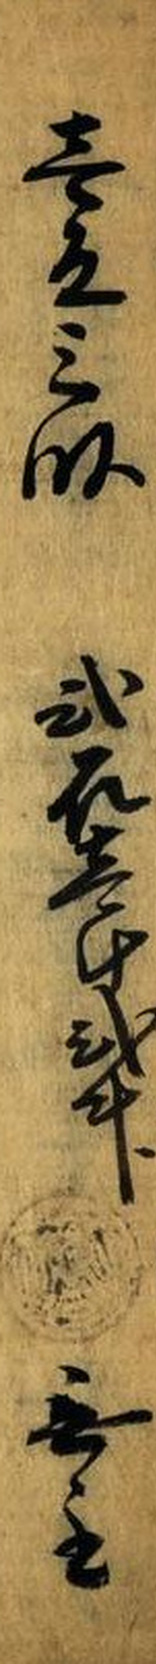同壱反三畝弐石壱斗弐升㊞無主
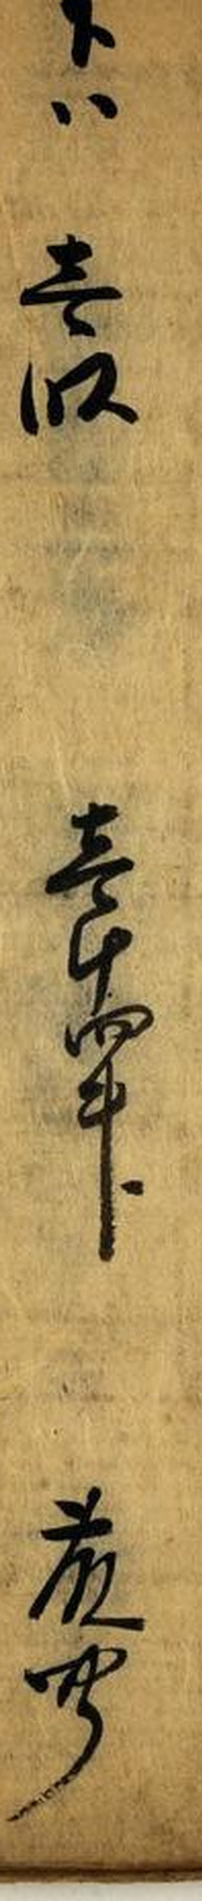下同壱畝壱斗四升藤四郎
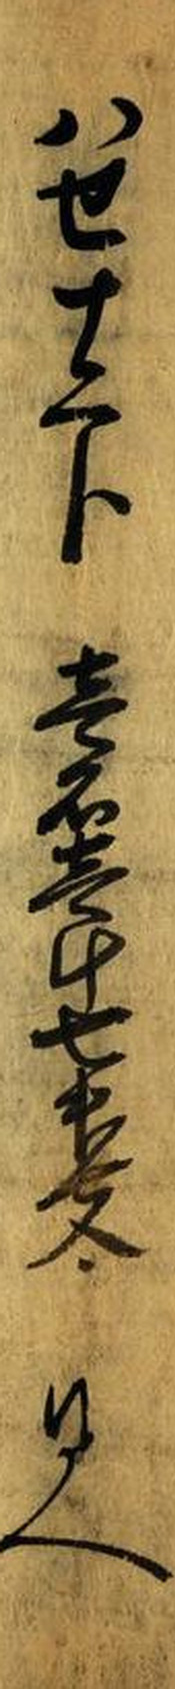同八セ十二分壱石壱斗七升七合同人
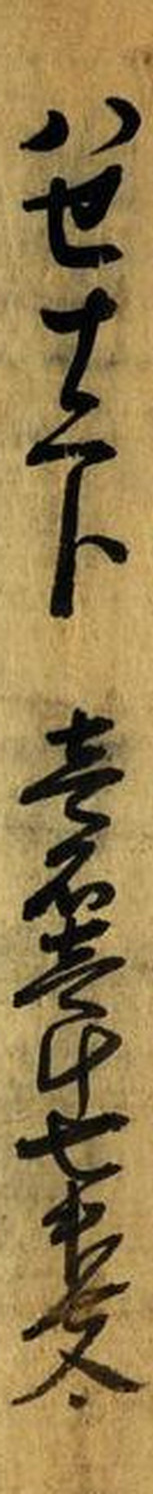同八セ十二分壱石壱斗七升七合同人
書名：越前国西方内志津庄内本折村御検地帳
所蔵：福井県文書館 Fukui Prefectural Archives
